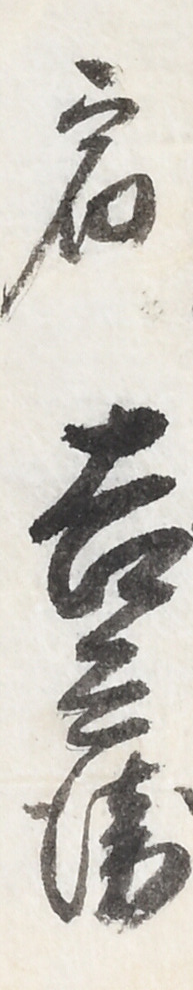宿吉兵衛
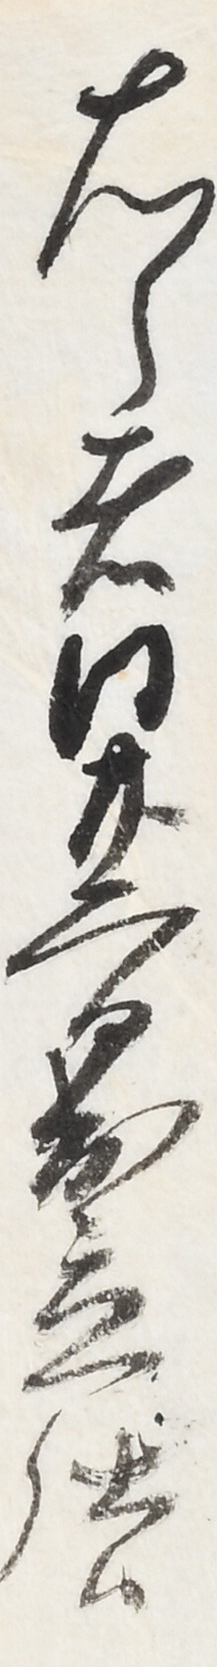右之者同廿二日出立仕候
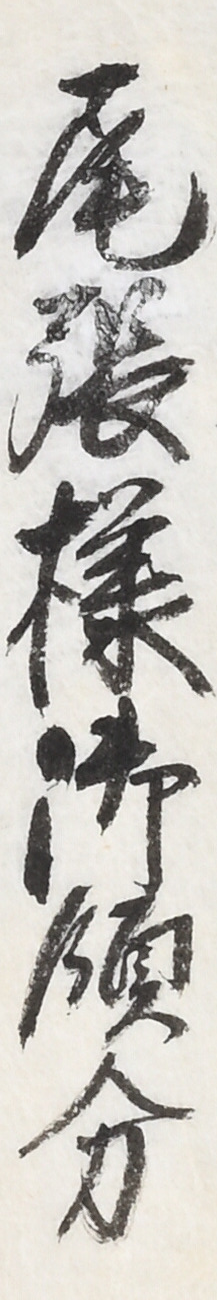尾張様御領分
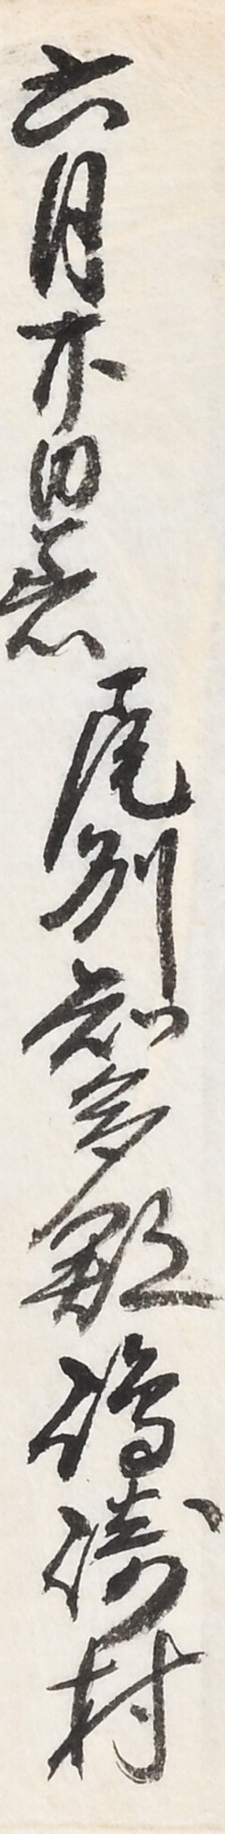六月廿日着尾州知多郡嶋崎村
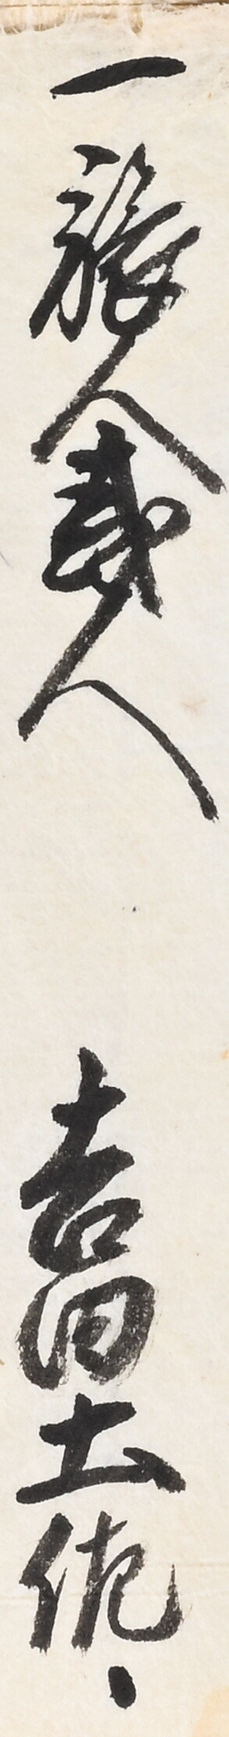一旅人弐人吉田土佐・
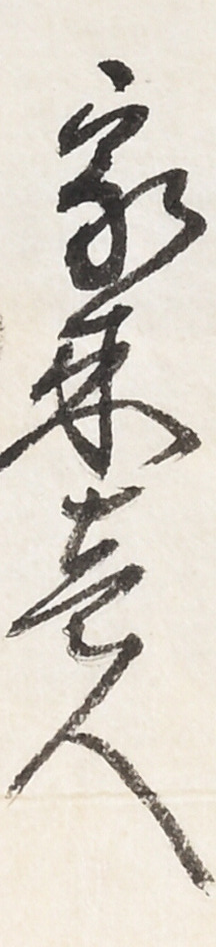家来壱人
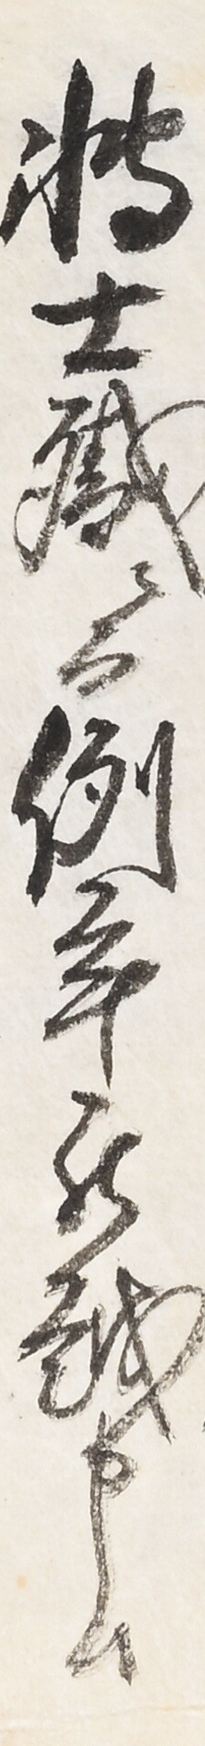転士職ニ而例年罷越申候
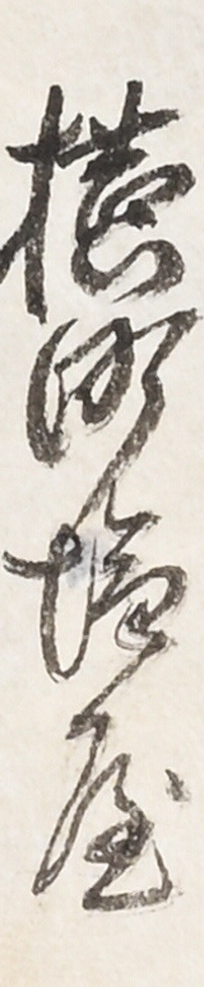横町塩屋
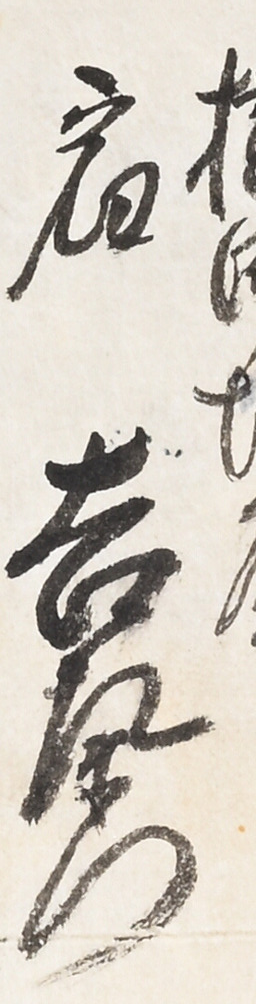宿吉左衛門
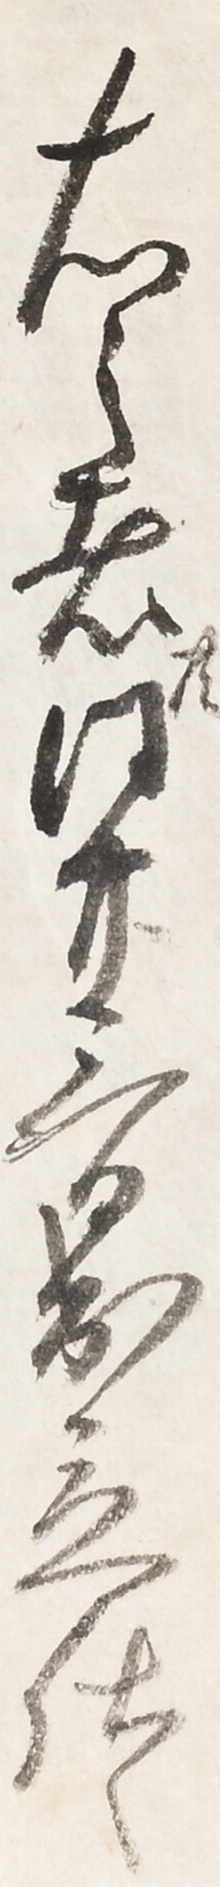右之者同廿二日出立仕候
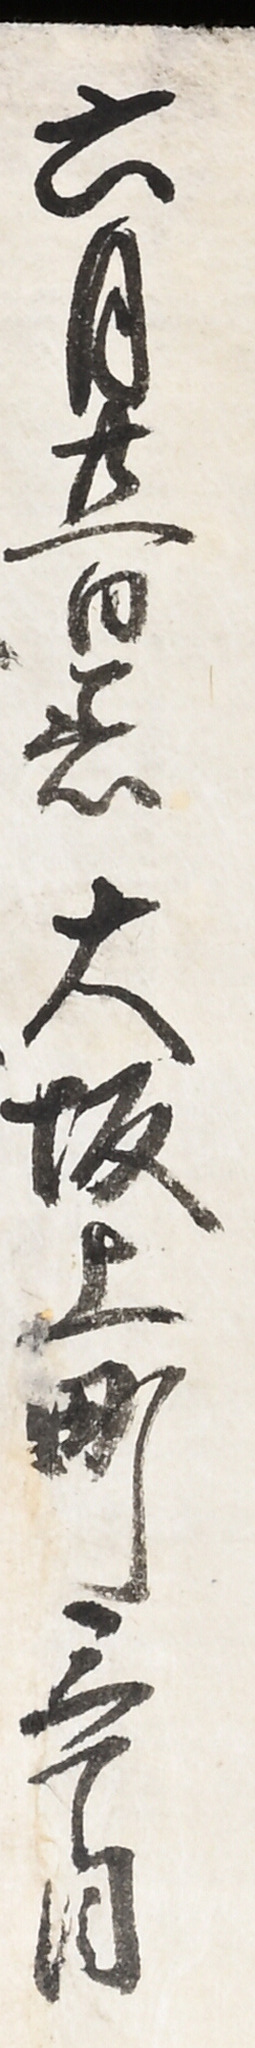六月廿一日着大坂上町三丁目
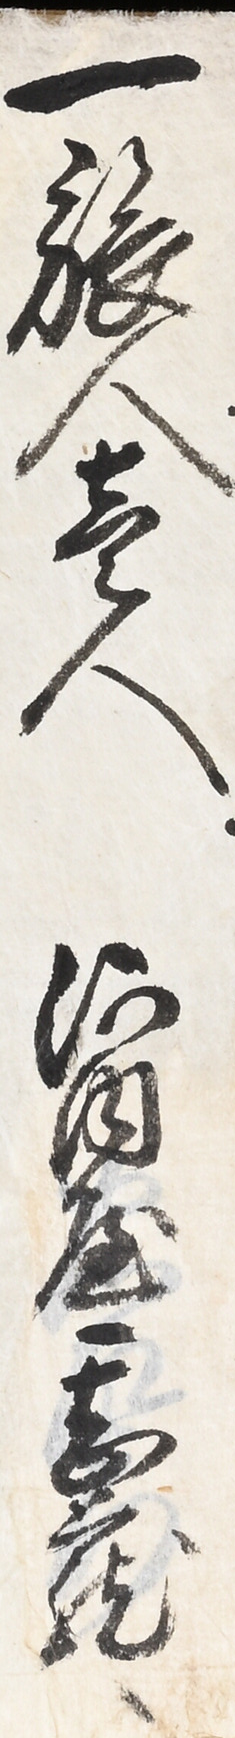一旅人壱人河内屋甚蔵・
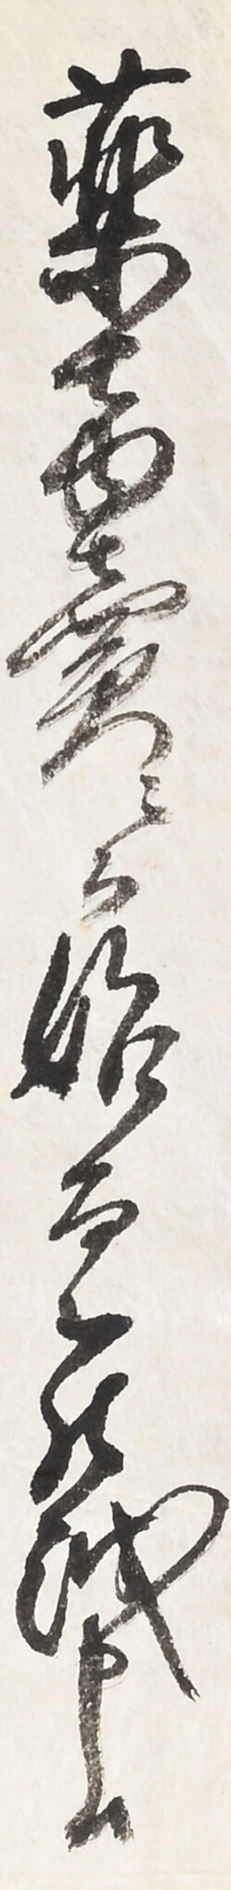薬商売ニ而始而罷越申候
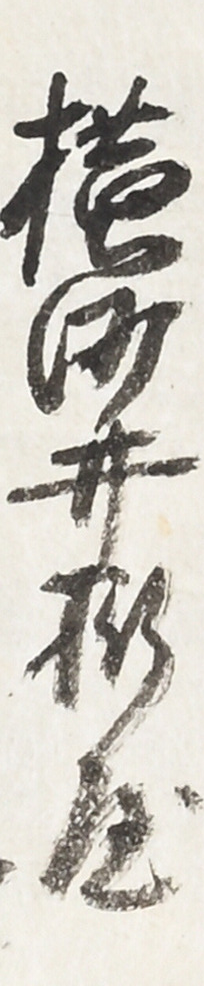横町井桁屋
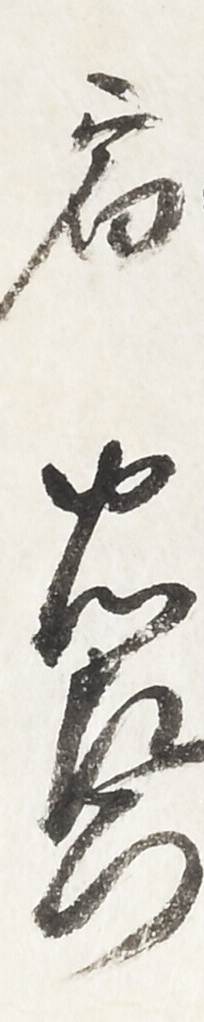宿忠左衛門
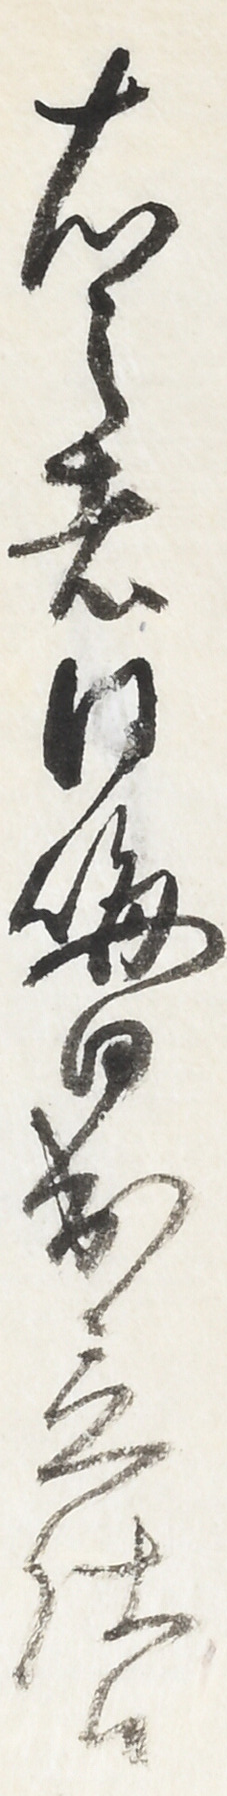右之者同晦日出立仕候
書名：旅人泊控帳
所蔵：伊那市立高遠町図書館・合同会社AMANE
